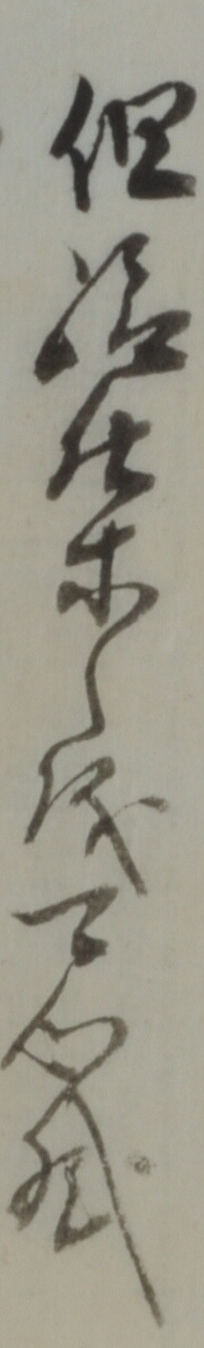但給仕等之儀可心掛
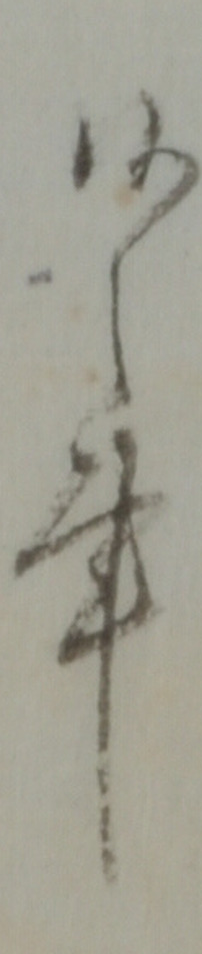候之事
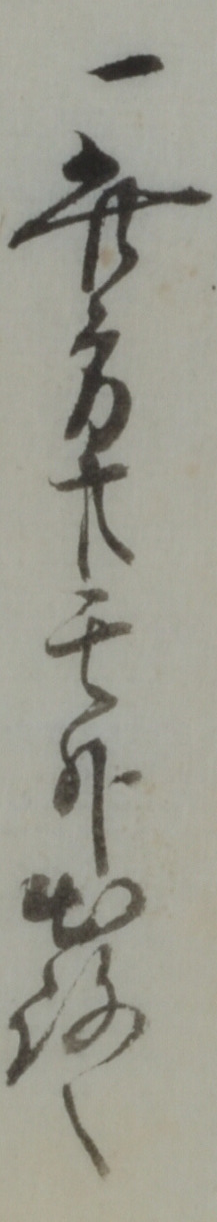一此方共其外出役之
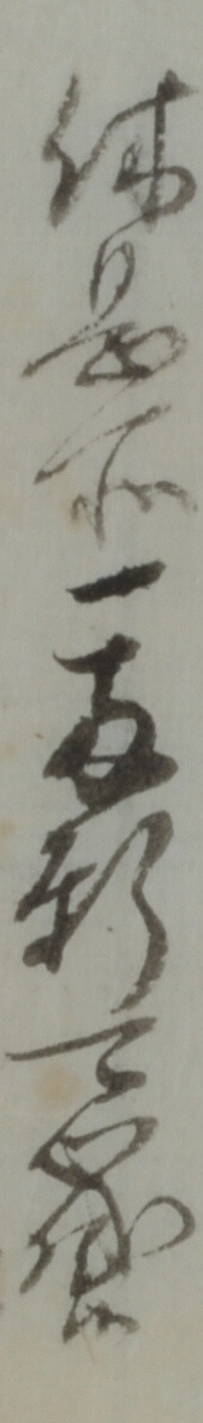休息所一両軒可心掛候
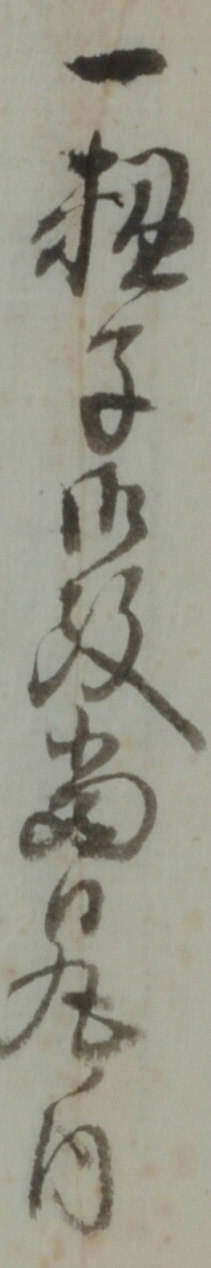一籾子御改当日丸ノ内
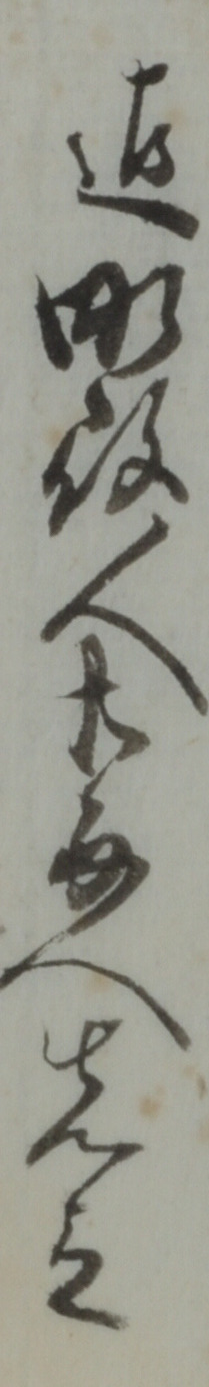迄町役人共両人先立
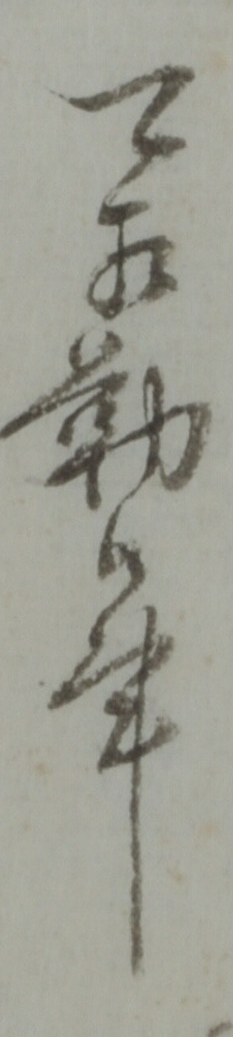可相勤候事
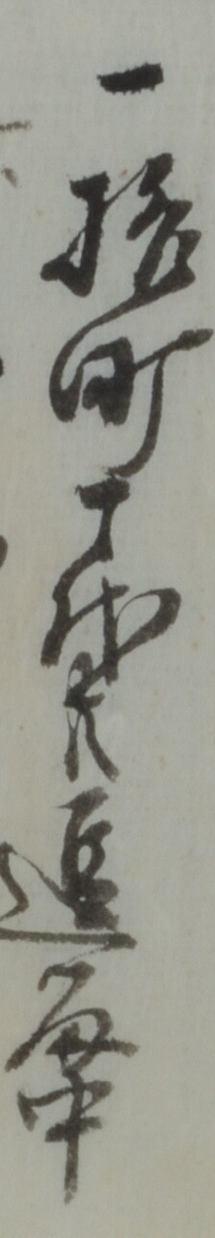一拾町丁代共逗留中
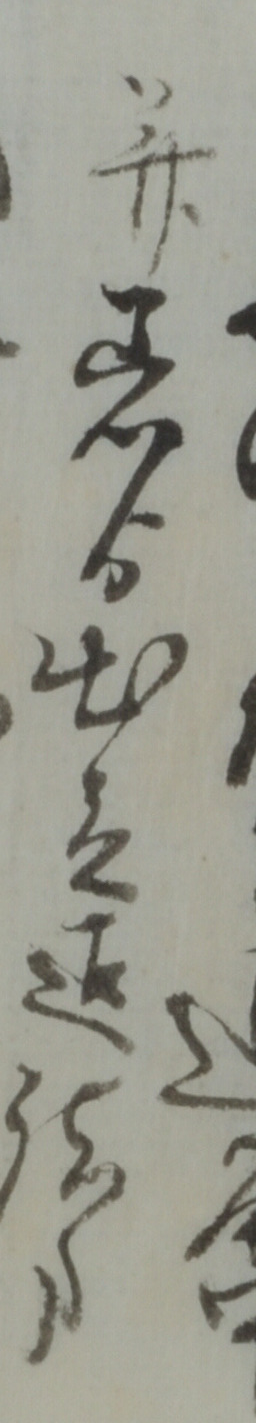并着ゟ出立迄諸事
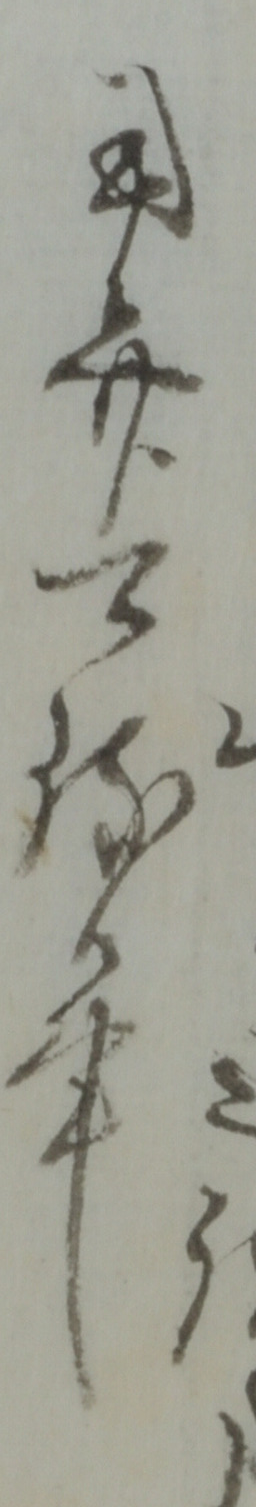用弁可致候事
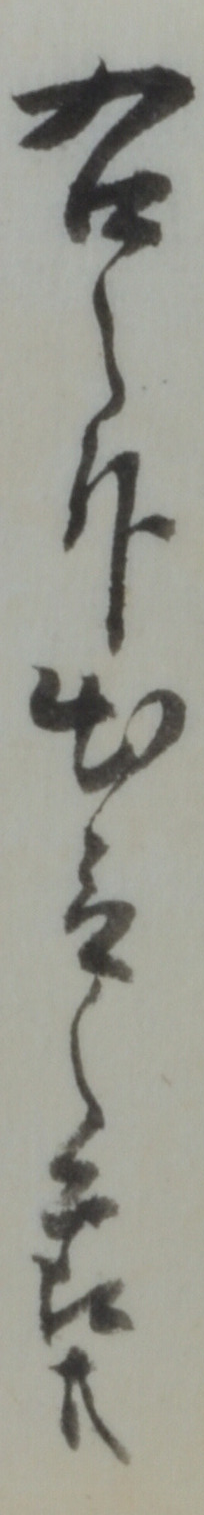右之外出立之節共

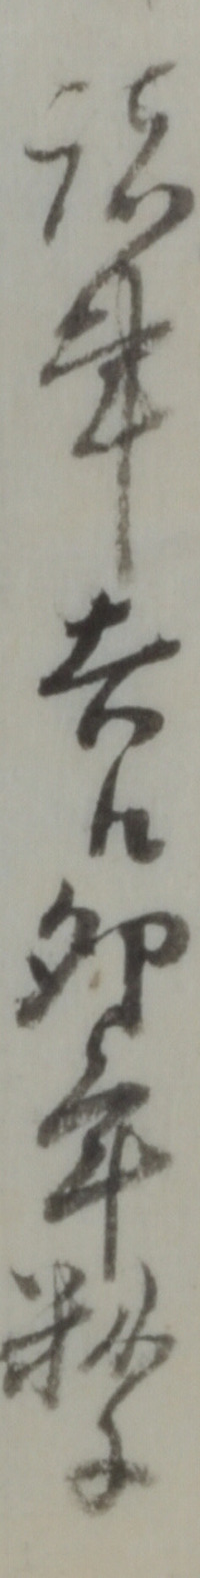諸事去ル卯年籾子
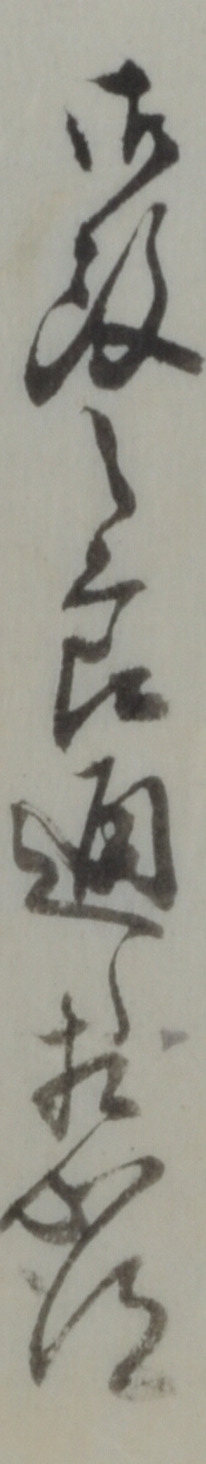御改之節通り相心得
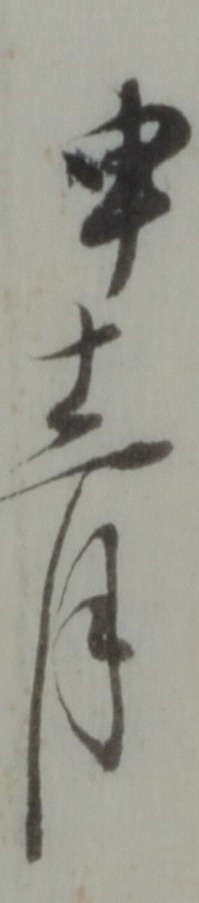申十二月
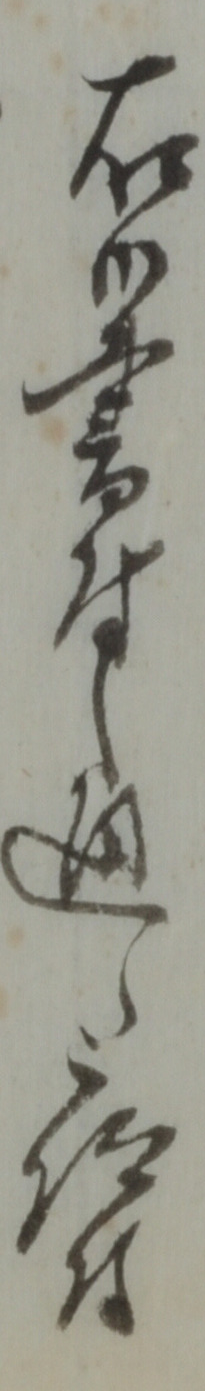右御書付之通り被仰付
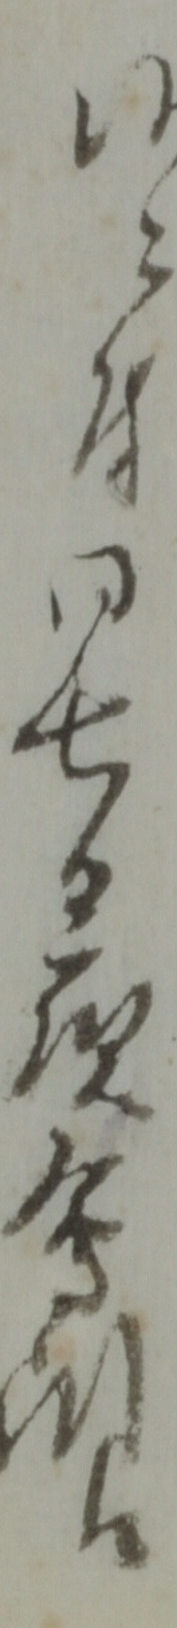候ニ付同七日夜会所江
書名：御勘定御普請役江戸御役人様諸事控
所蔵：伊那市立高遠町図書館・合同会社AMANE
